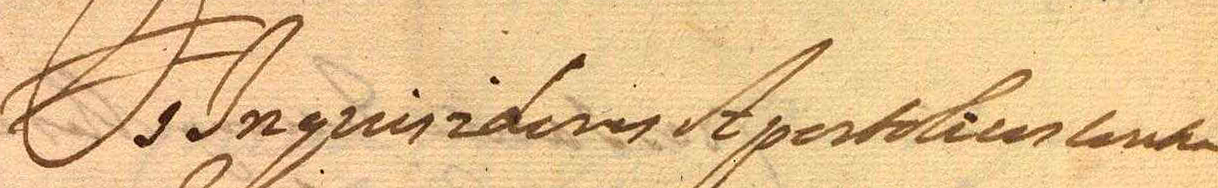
Os Inquisidores Apostolicos contra
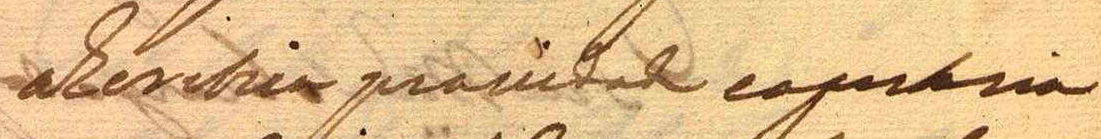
a heretica prauidade e apostazia
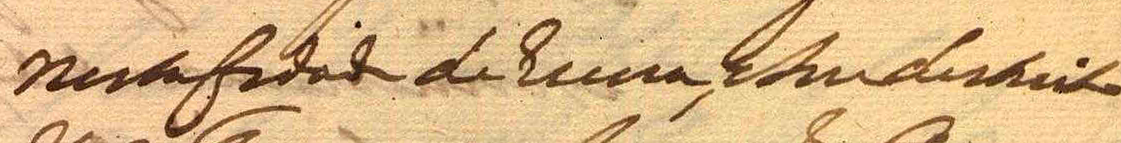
nesta Cidade de Euora, e seu destricto
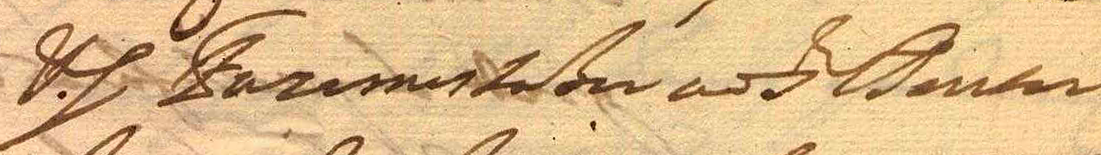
V. S Fazemes saber ao sor Doutor
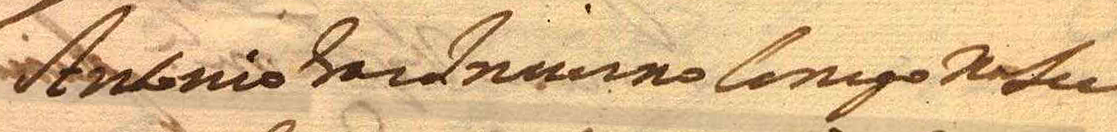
Antonio Vaz Inuerno Conego na See
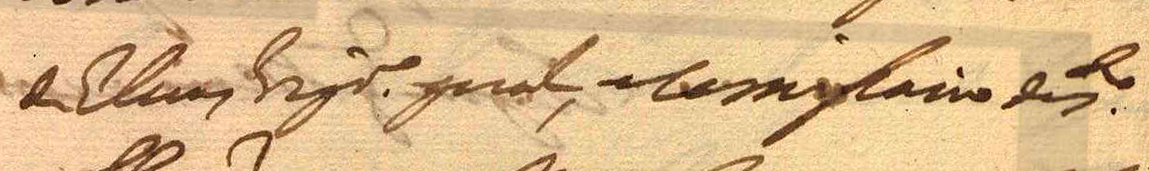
de Eluas Vigr.o geral, e comissairo de s.to
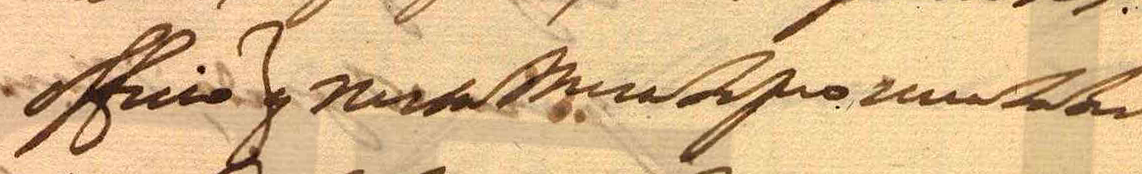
officio q̄ nesta Meza se procura saber
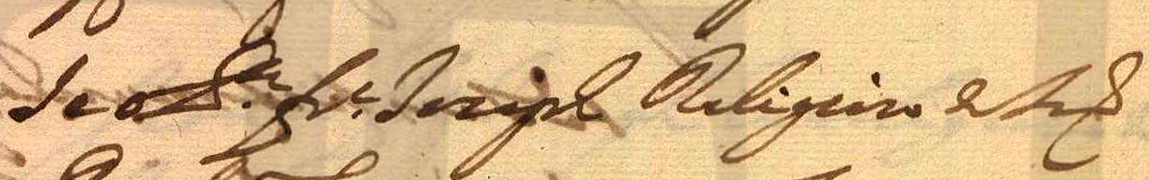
se o P.e fr.e Iozeph Religiozo de Saõ
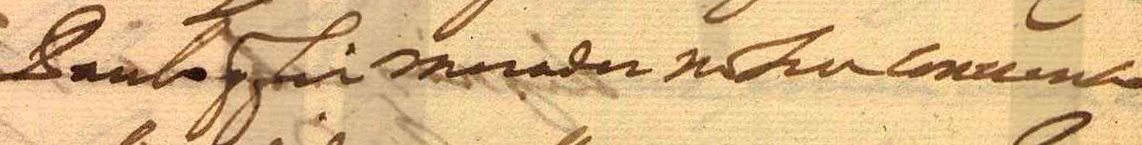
Paulo q̄ foi morador no seu conuento
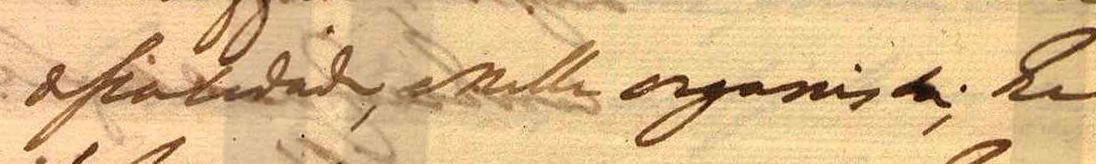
dessa cidade, e nella organista; he
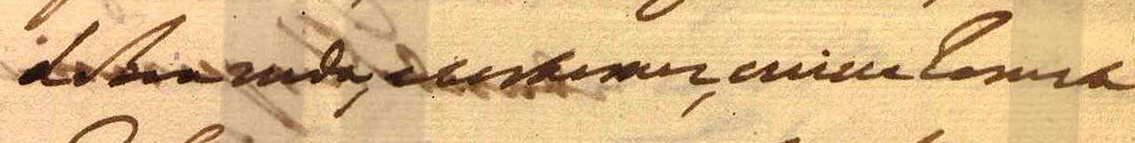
de boa uida, e costumes, e uiue homra
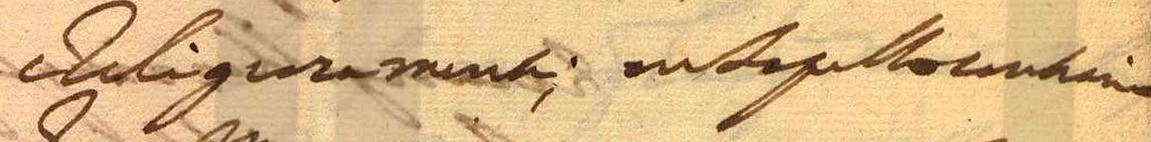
e Religiozamente; ou se pello contrario
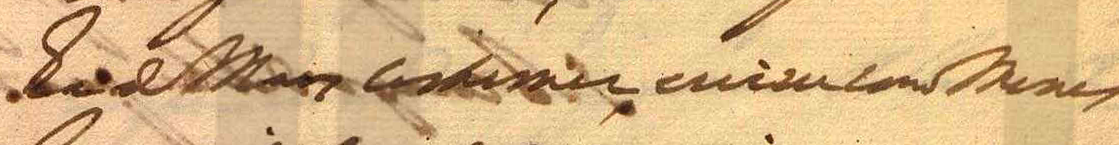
he de Maos costumes, e uiue com Menos
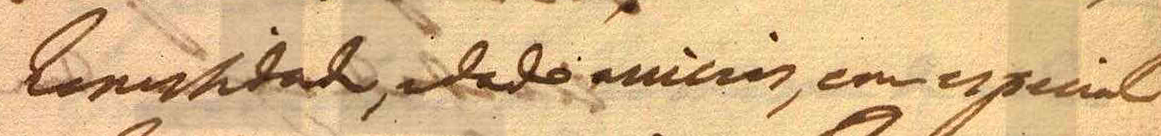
honestidade, e dado a uicios, em especial
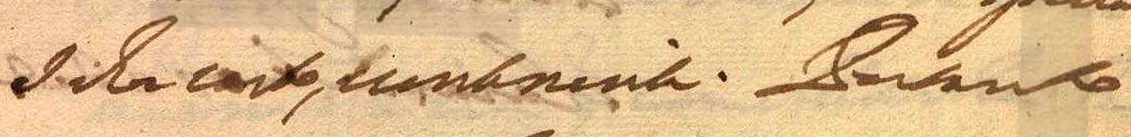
se he certo, e continente. Portanto
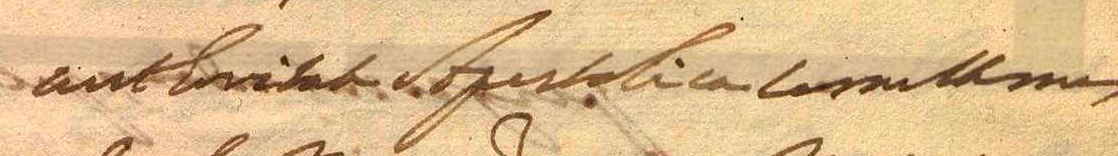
authoritate Apostolica comettemos
